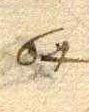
64
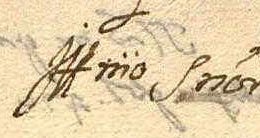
Jllmo Snōr
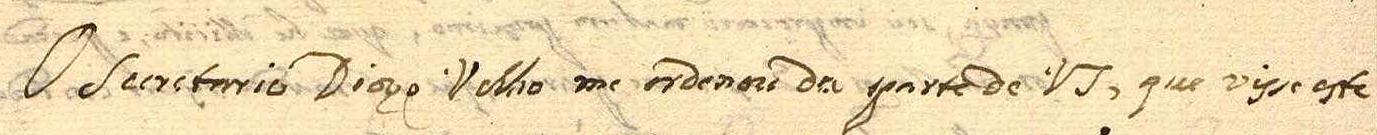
O Secretario Diogo Velho me ordenou da parte de VS que visse este
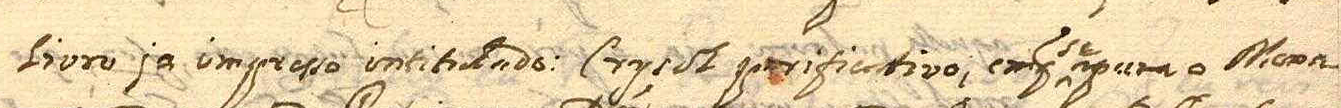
livro ja impresso intitulado: Crysol purificativo, em q̄ se apura o Mona
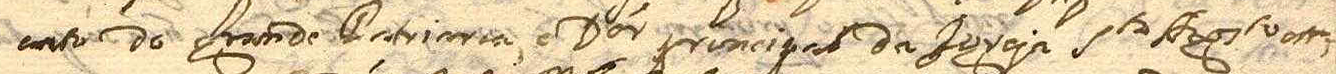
cato do Grande Patriarca, e Dor̄ principal da Jgreja S.to Agosto em
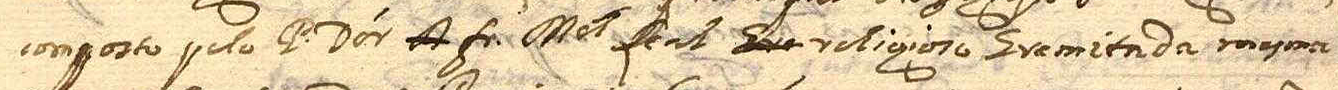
composto pelo P. Dor̄ fr. Mel Leal Ere religioso Eremita da mesma
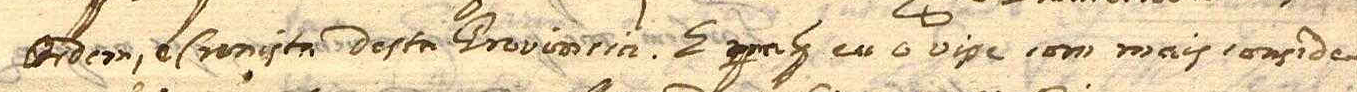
Ordem, e Cronista desta Provincia. E ꝑa q̄ eu a visse com mais conside
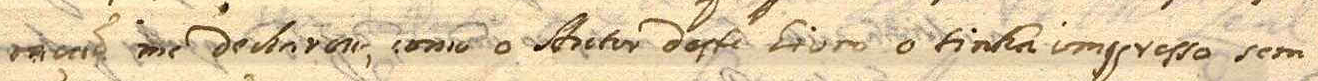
raçaõ me declarou, como o Autor deste Livro o tinha impresso sem
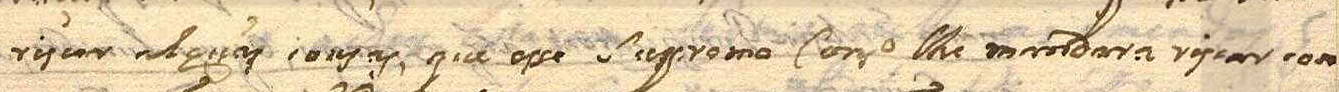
riscar alguās cousas, que esse supremo Conso lhe mandara riscar com
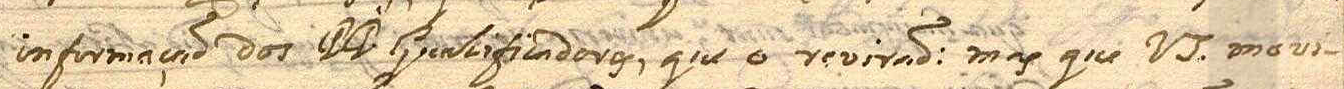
informaçaõ dos PP Qualificadores, que o reviraõ: mas que VS. movi
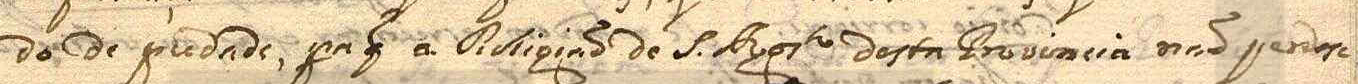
do de piedade, ꝑa q̄ a Religiaõ de S. Agosto desta Provincia naõ perdese
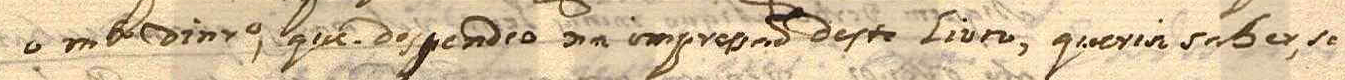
o mto dinro, que despendeo na impressaõ deste Livro, queria saber, se
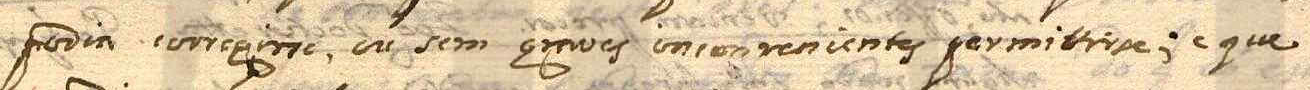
podia corregirse, ou sem graves inconvenientes permittirse; e que
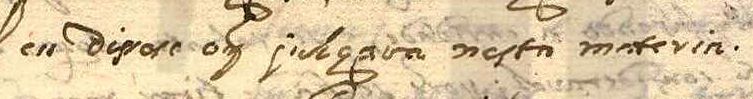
eu dissese o q̄ julgava nesta materia.
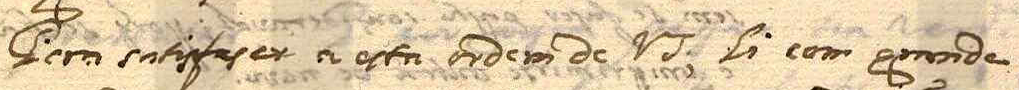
Pera satisfaser a esta ordem de VS; Li com grande
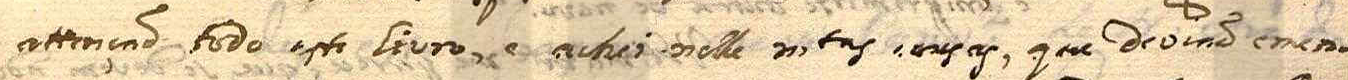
attençaõ todo este Livro, e achei nelle mtas cousas, que deviaõ emen
